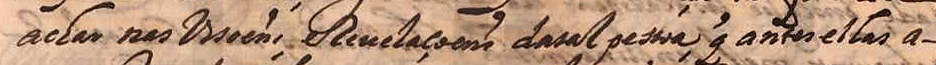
achar nas Visoens, e Reuelaçoens da tal pessoa, q̄ antes ellas a
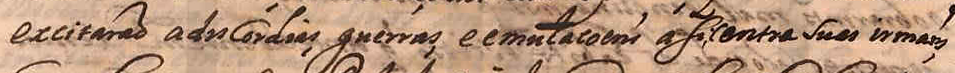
excitaraõ a discordias, guerras, e emulaçoens asi contra suas irmans
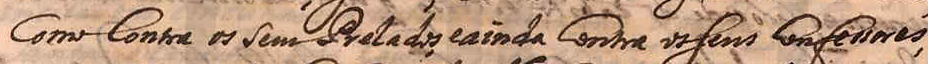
Como Contra os seu Prelados, e ainda Contra os seus Confessores,
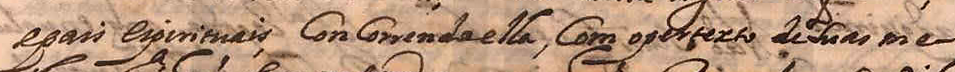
e pais espirituais, ConCorrendo ella, Com o pertexto de suas me
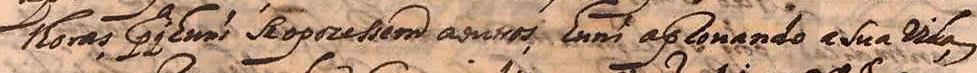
lhoras, pa q̄ huns se opozessem a outros, huns apRouando a sua vida,
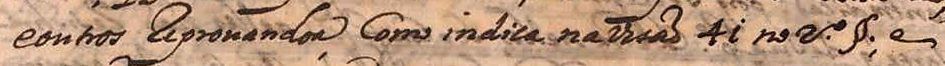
e outros Reprouandoa, Como indica na visaõ 41 no 2.o §; e
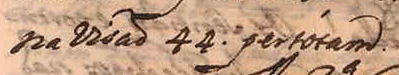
na visão 44. per totam.
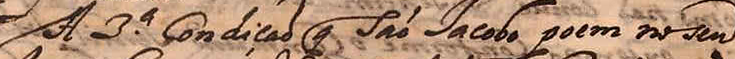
A 3.a Condiçaõ q̄ saõ Iacobo poem no seu
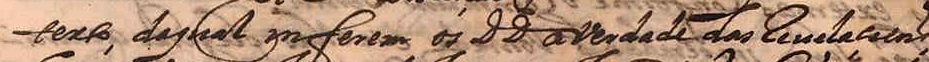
texto, da qual inferem os DD a verdade das Reuelaçoens,
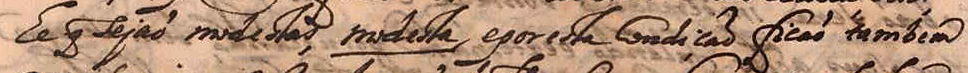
he q̄ sejaõ modestas, modesta, e por esta Condiçaõ ficaõ tambem
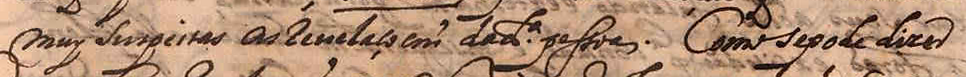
muy suspeitas as Reuelaçoens da d̄a pessoa. Como se pode dizer
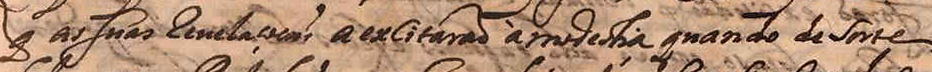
q̄ as suas Reuelaçoens a excitaraõ à modestia, quando de sorte
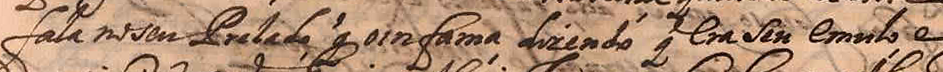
fala no seu Prelado, q̄ o infama, dizendo q̄ Era seu Emulo, e
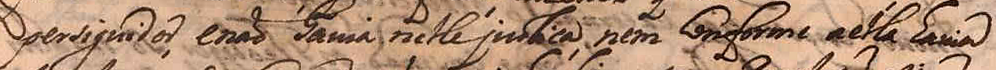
persiguidor, e naõ hauia nelle justiça, nem Conforme a ella hauia
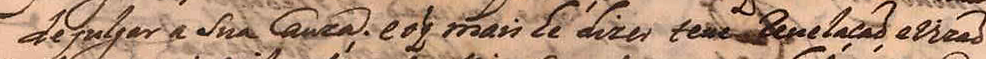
de julgar a sua Cauza; e o q̄ mais he dizer teue Reuelaçaõ, e vizaõ
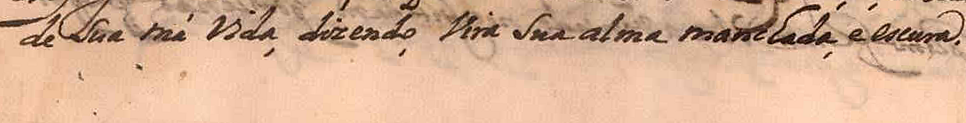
de sua má Vida, dizendo, vira sua alma manchada, e escura.
